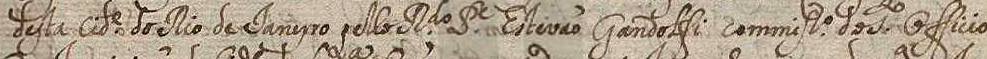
desta cid̄.e do Rio de Ianeyro pello R.do P.e Estevaõ Gandolfi commisr.o do s.to Officio
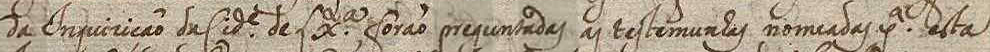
da Inquiziçaõ da Cid.e de Lx.a, foraõ preguntadas as testemunhas nomeadas p.a esta
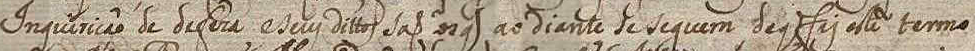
Inquirição de defeza, e seus dittos saõ os q̄ ao diante se seguem, de q̄ fis este termo
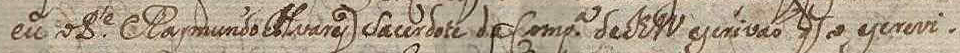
eu o P.e Raymundo Alvares Sacerdote da Camp.a de IESV escrivaõ q̄ o escrevi.
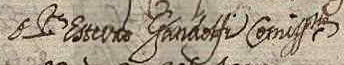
o Pe Estevaõ Gandolfi Comissro
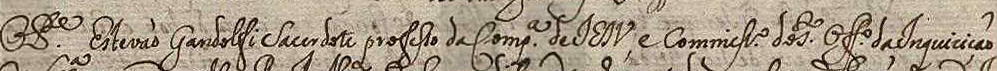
O P.e Estevaõ Gandolfi Sacerdote professo da Comp.a de IESV, e Commiss.o do s.to Off.o da Inquizição
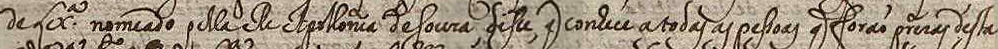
de Lix.a nomeado pella Re Apollonia de souza, disse, q̄ conhece a todas as pessoas q̄ foraõ prezas desta
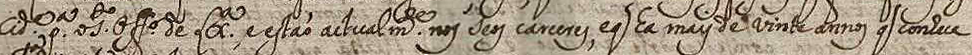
cid.e p.a o s.to off.o de Lix.a, e estaõ actualm.te nos seos carceres, e q̄ ha mais de vinte annos q̄ conhece
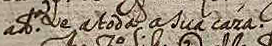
a d̄.a e a toda a sua caza.
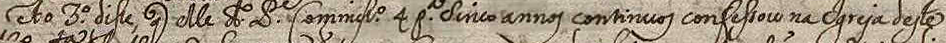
Ao 3.o disse, q̄ elle d̄.o P.e Commiss.o 4 p.a sinco annos continuos confessou na Igreja deste
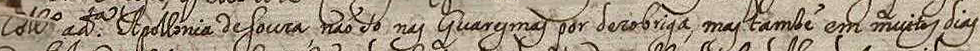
Collo a d̄.a Apollonia de souza naõ só nas Quaresmas por dezobriga, mas tambē em muitos dias
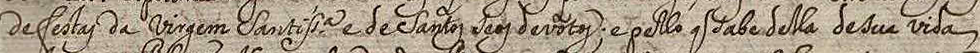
de festas da virgem Santiss.a e de Santos seos devotos; e pello q̄ sabe della de sua vida
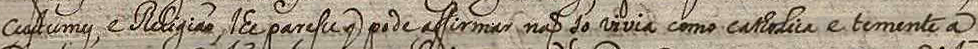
custumes, e Religiaõ, lhe paresse q̄ pode affirmar naõ so vivia como catholica e temente a
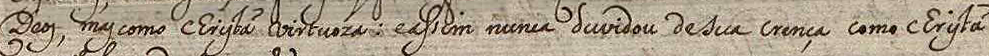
Deos, mas como christã virtuoza: e assim nunca duvidou de sua crença como christã
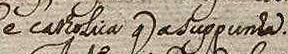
e catholica q̄ a suppunha.
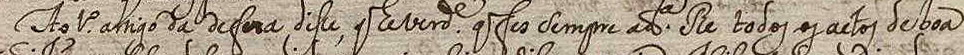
Ao 1.o artigo da defeza disse, q̄ he verd.e q̄ fes sempre a d̄.a Re todos os actos de boa
